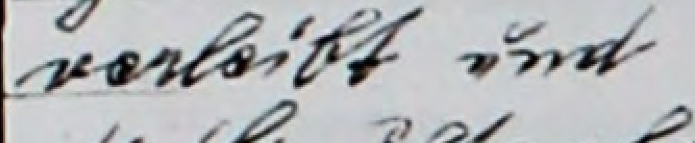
verleibt und
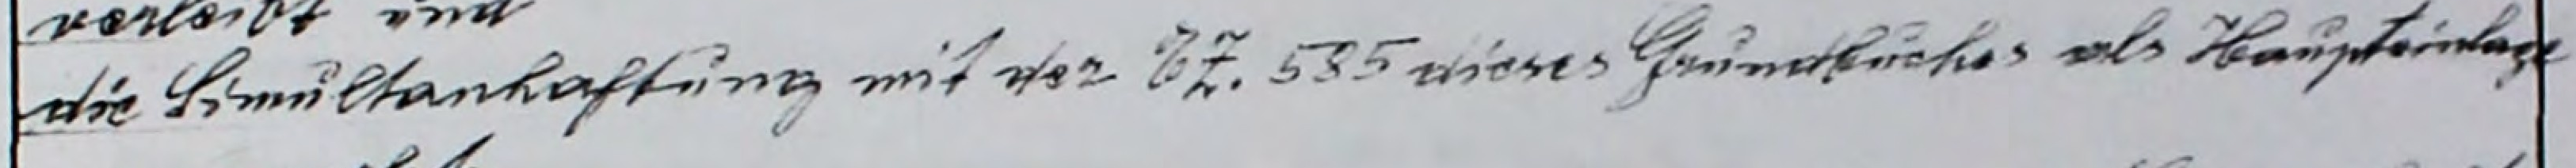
di Simultanhaftung mit der EZ. 585 dieser Grundbuches als Haupteinlage
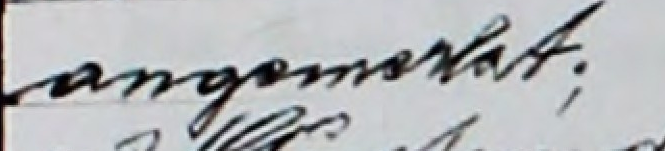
angemerkt;
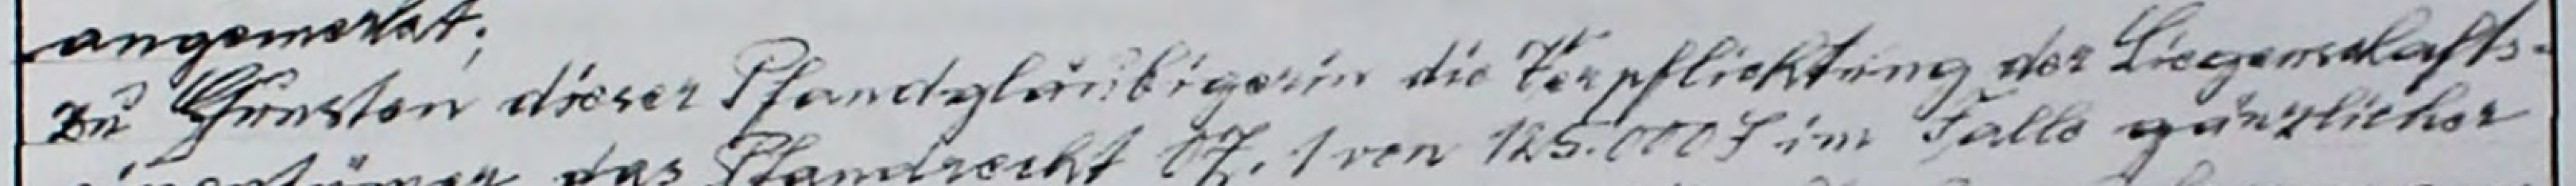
Zu Gunsten dieser Pfandgläubigerin die Verpflichtung der Liegenschafts=
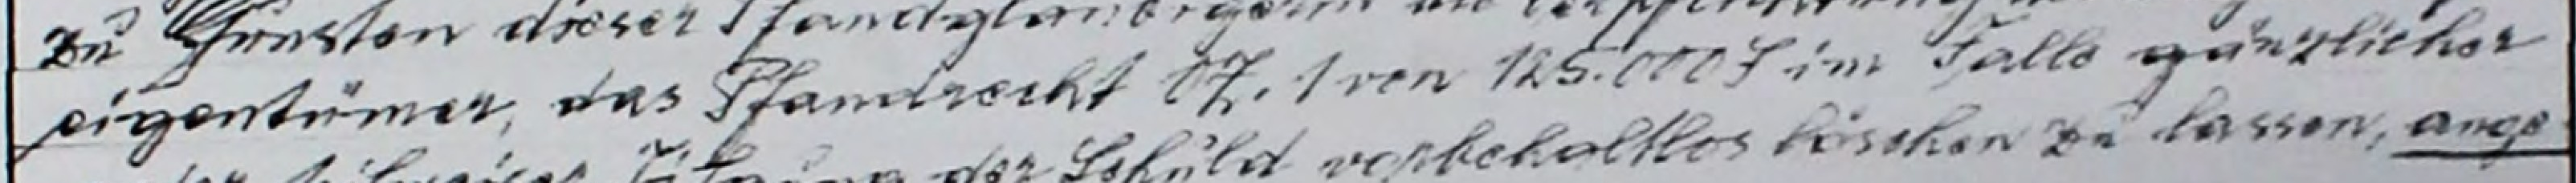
eigentumer, das Pfadrecht OZ. 1 von 125.000 F im Falls gänzlicher
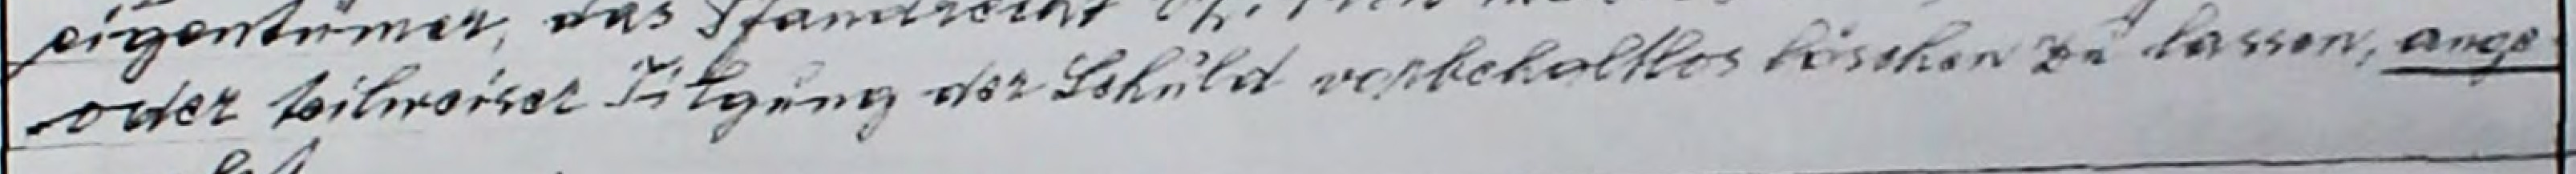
oder teilweiser Tilgung der Schuld vorbehaltlos böschen zu lassen, ange=
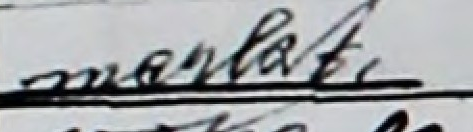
merkt.
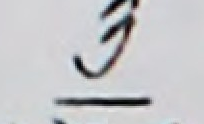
3
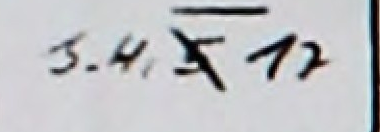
s. 4, 5 17
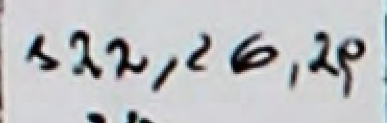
s 22, 26, 29
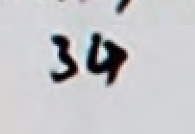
34
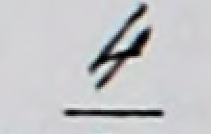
4
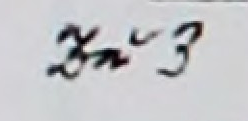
Zu 3
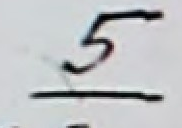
5
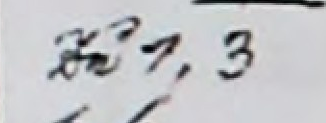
Zu 1, 3
